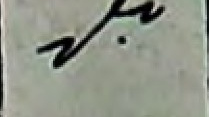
do
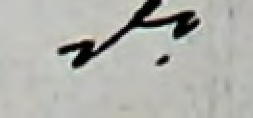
do
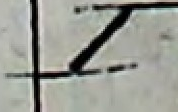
I
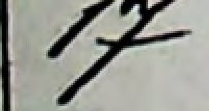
17
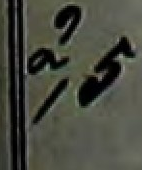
2,5
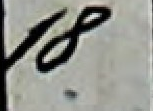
18
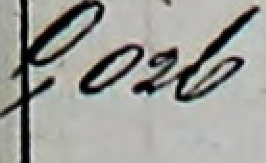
0,026
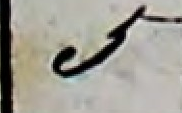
5
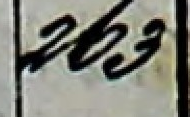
263
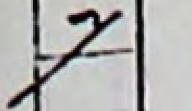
7
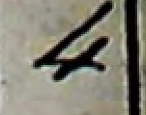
4
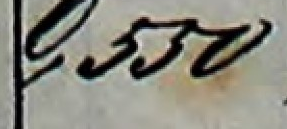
0,550
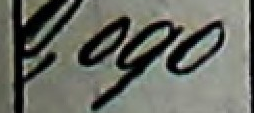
0,090
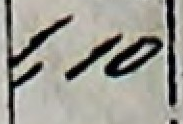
1,10
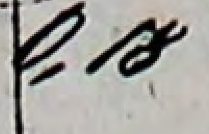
0,18
